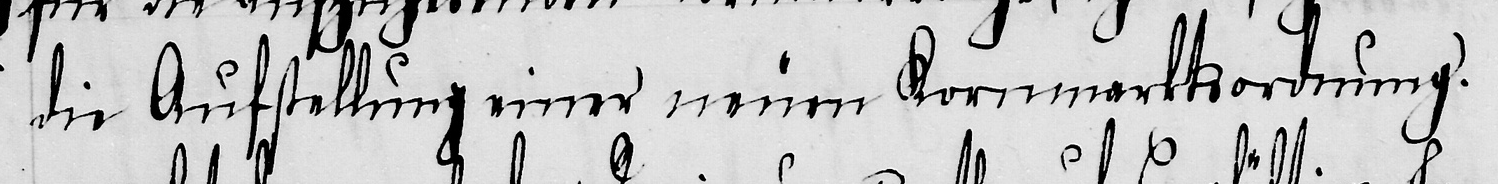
die Aufstellung einer neuen Kornmarktsordnung.
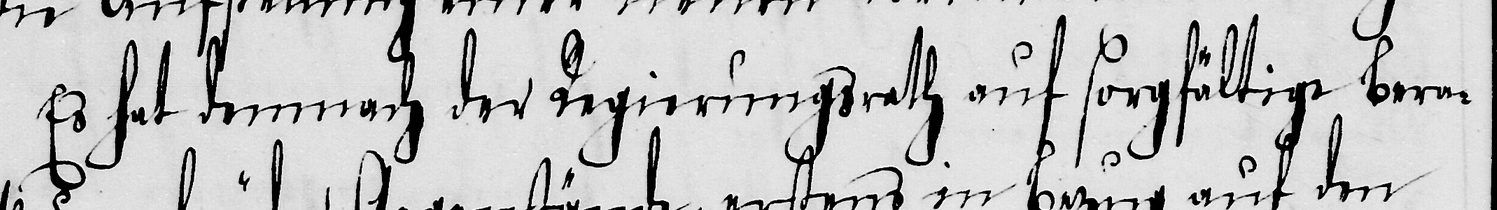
Es hat demnach der Regierungsrath auf sorgfältige Bera¬
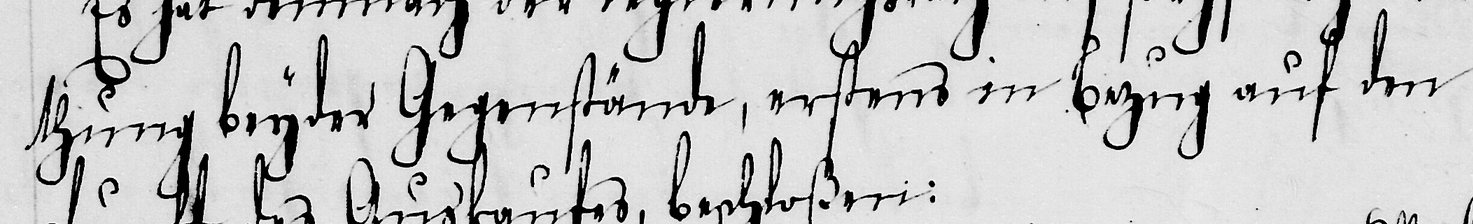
thung beyder Gegenstände, erstens in Bezug auf den
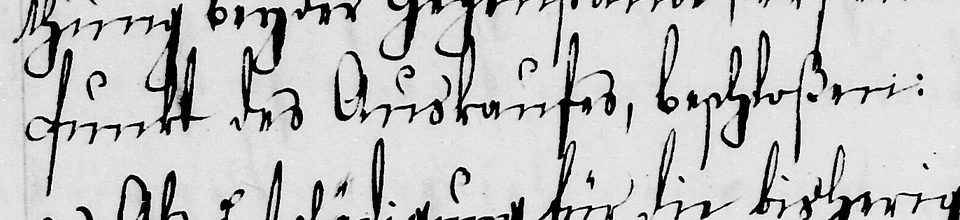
Punkt des Auskaufes, beschloßen:
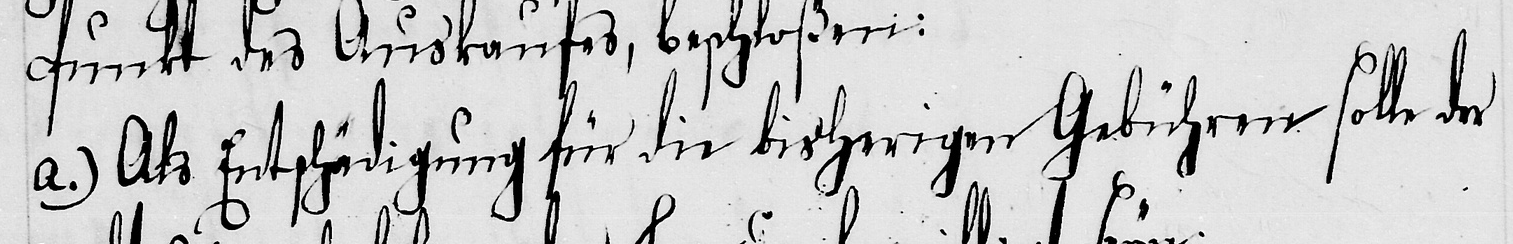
a.) Als Entschädigung für die bisherigen Gebühren solle
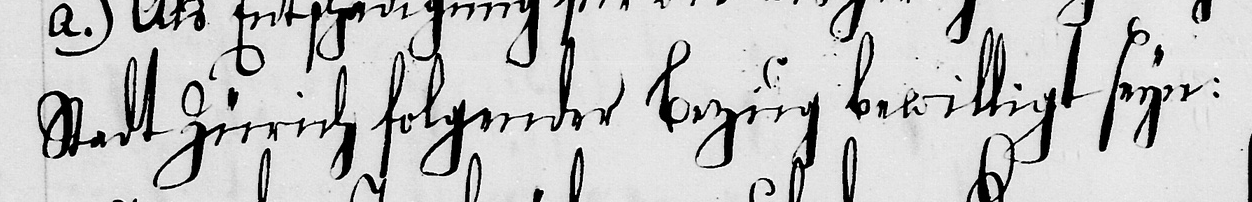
Stadt Zürich folgender Bezug bewilligt seyn:
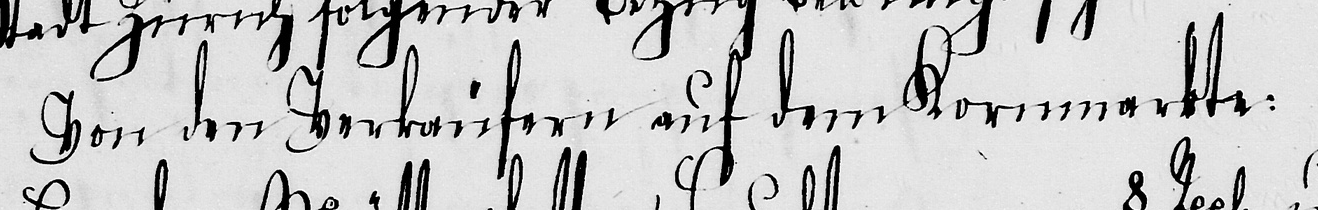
Von den Verkäufern auf dem Kornmarkte:
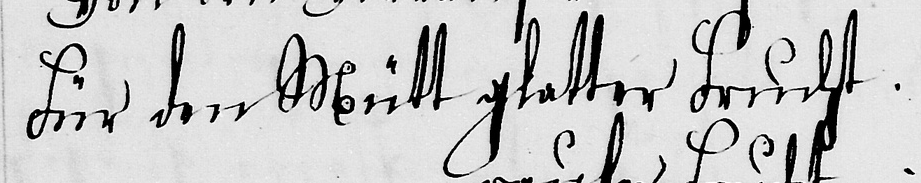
Für den Mütt glatter Frucht
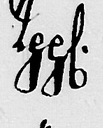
8.
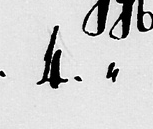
4.
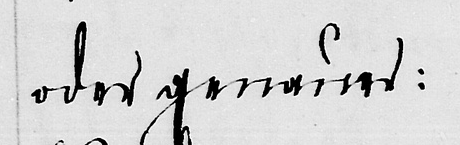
oder genauer:
